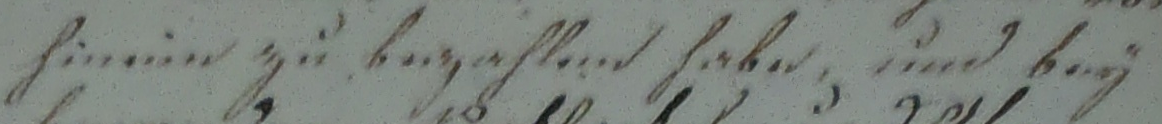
hinein zu bezahlen habe, und bey
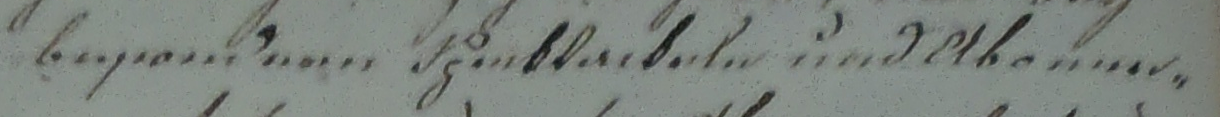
besonderen Spektackeln und Abonne¬
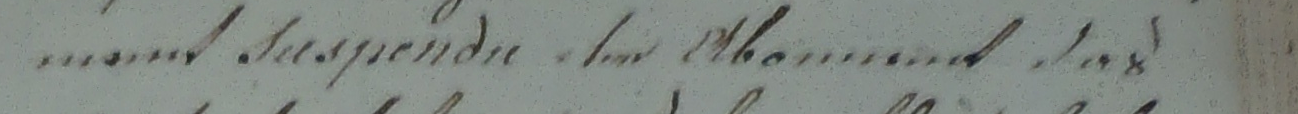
ment Suspendu der Abonnent
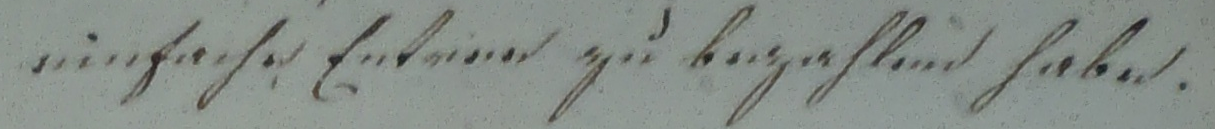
einfache Entree zu bezahlen habe.
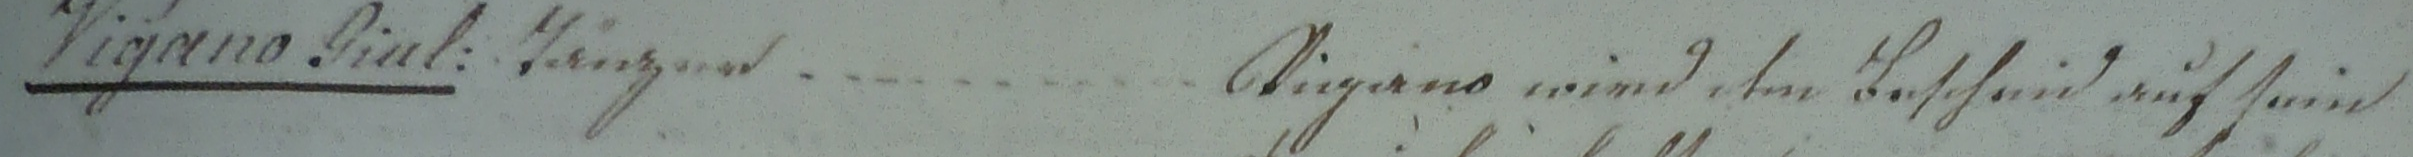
Vigano Giul: Tänzer ……….. Vigano wird den Bescheid auf sein
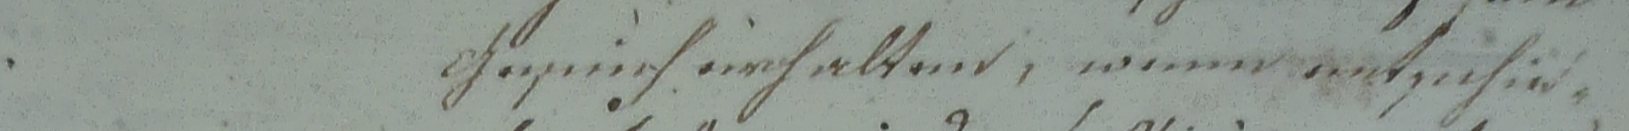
Gesuch erhalten, wenn entschie¬
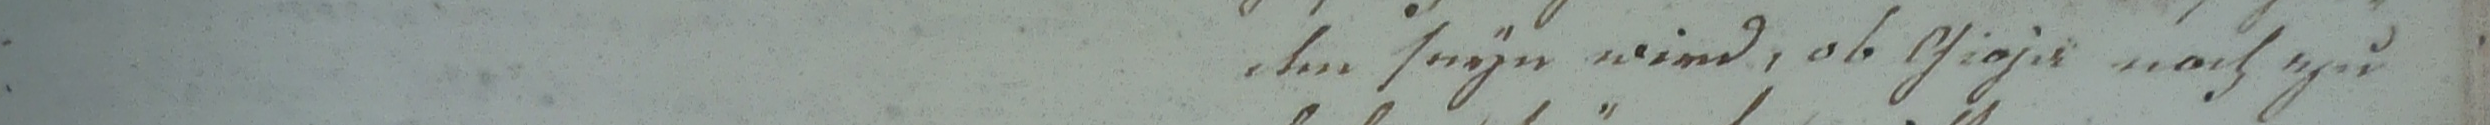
den seyn wird, ob Gioja noch zu
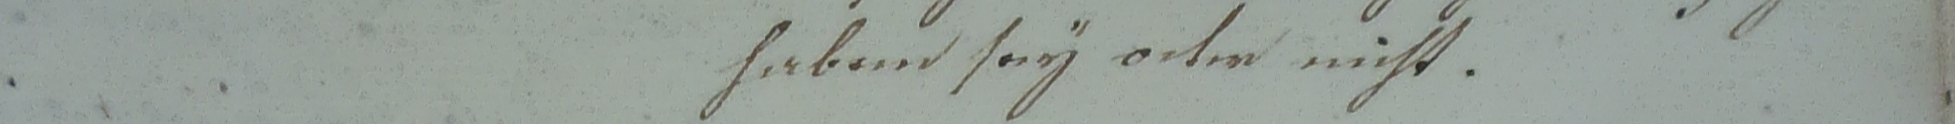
haben sey oder nicht.
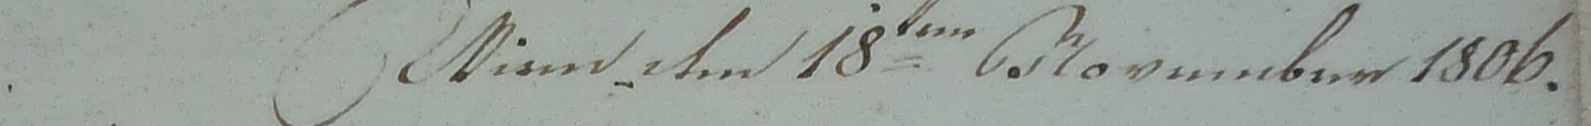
Wien den 18te͇n November 1806.
